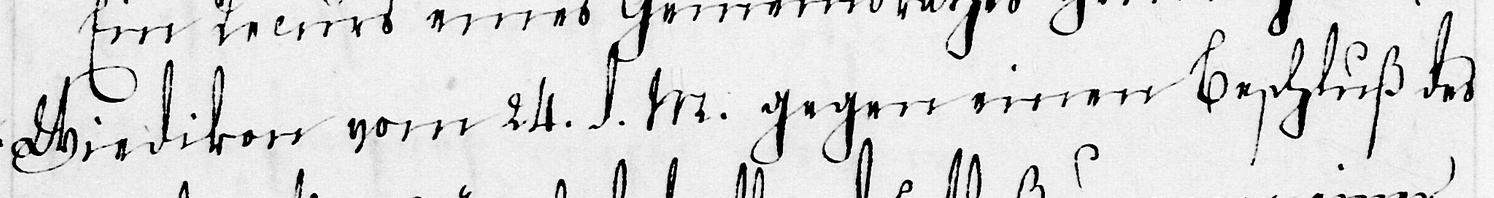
Wiedikon vom 24. d. M. gegen einen Beschluß des
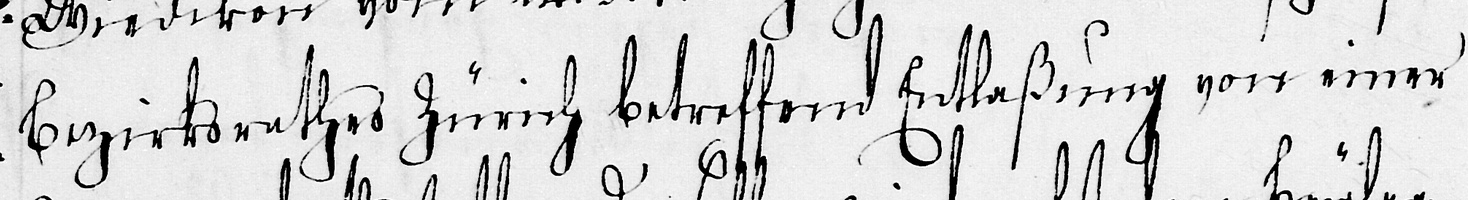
Bezirksrathes Zürich betreffend Entlaßung von einer
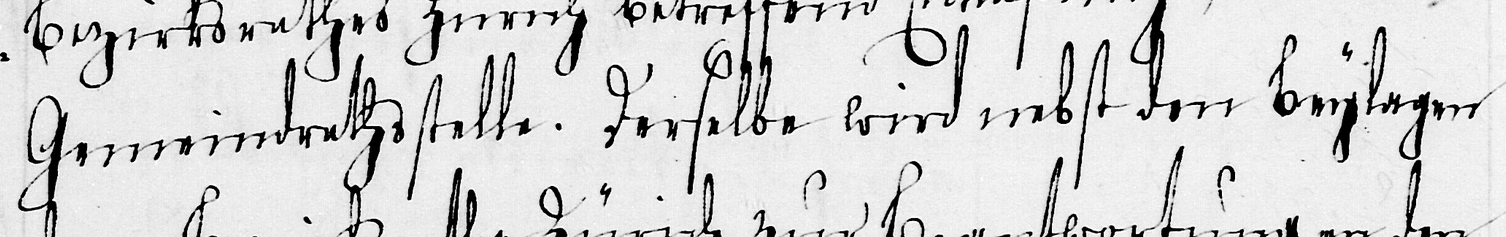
Gemeindrathsstelle. Derselbe wird nebst den Beylagen
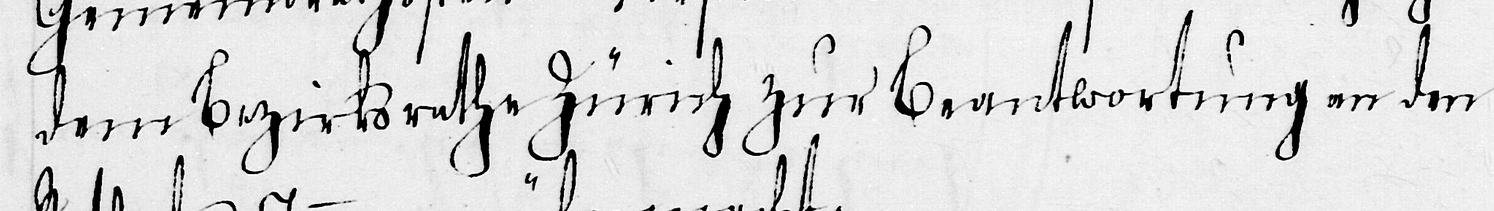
dem Bezirksrathe Zürich zur Beantwortung an den
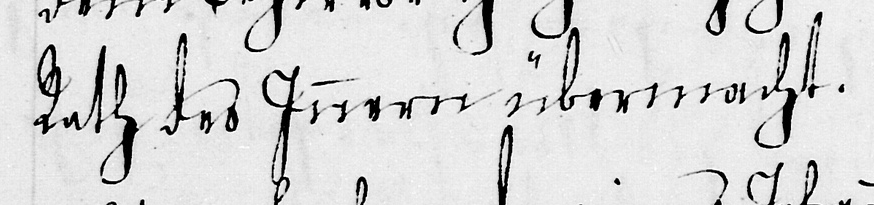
Rath des Innern übermacht.
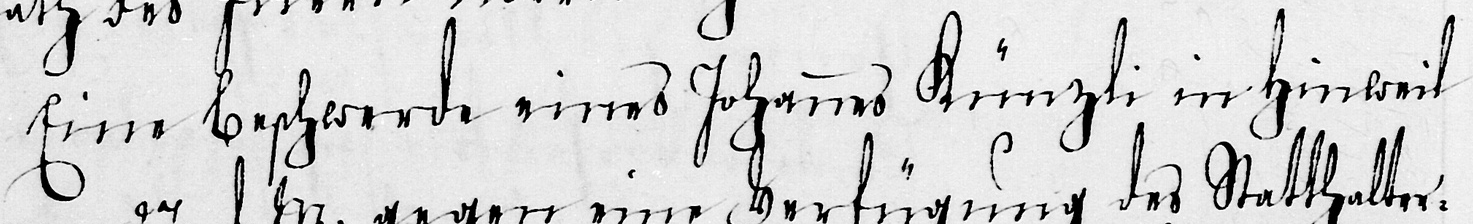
Eine Beschwerde eines Johannes Künzli in Hinweil
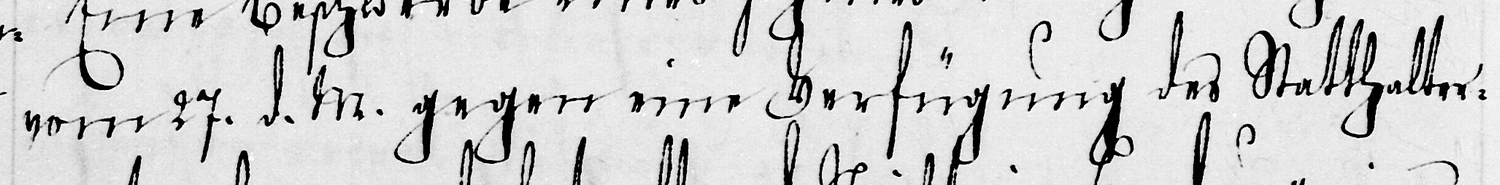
vom 27. d. M. gegen eine Verfügung des Statthalter¬
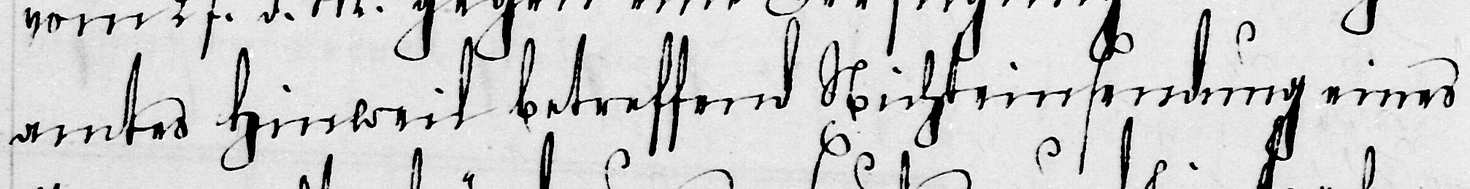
amtes Hinweil betreffend Nichteinsendung eines
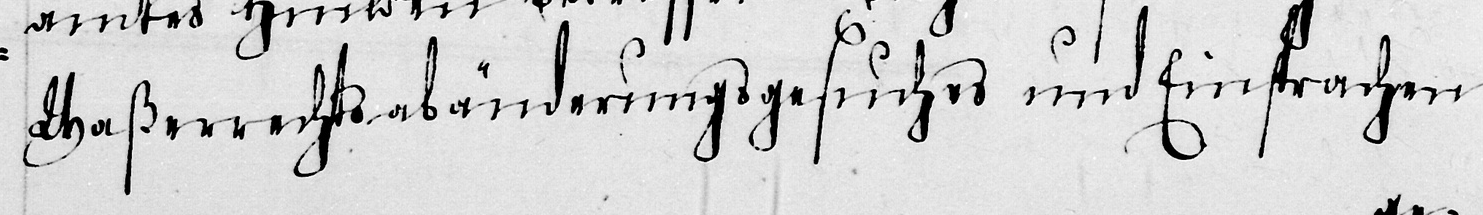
Waßerrechtsabänderungsgesuches und Einsprachen
